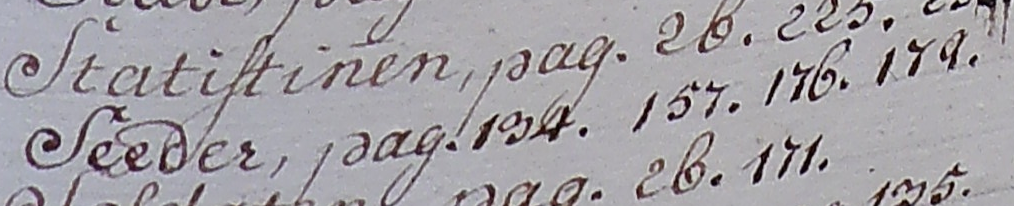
Seeder, pag. 134. 157. 176. 179.
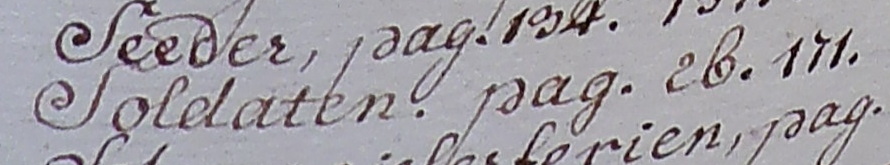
Soldaten. pag. 26. 171.
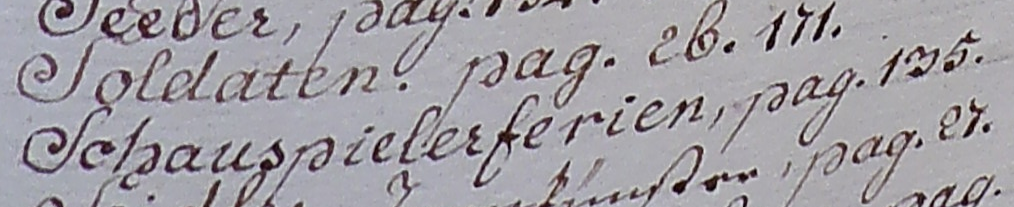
Schauspielerferien, pag. 135.
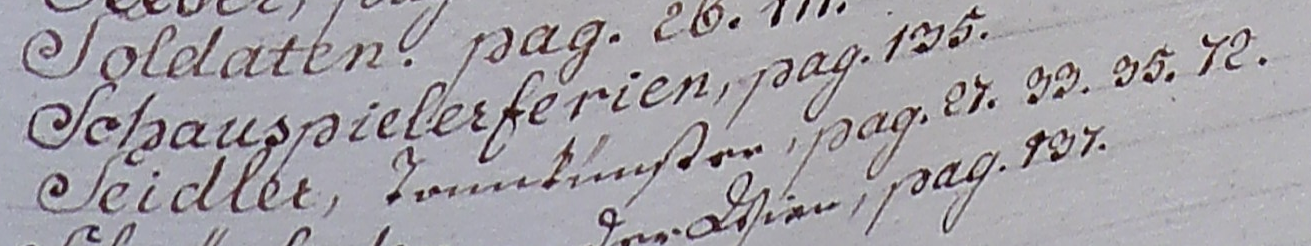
Seidler, Tonnkünster, pag. 27. 33. 35. 72.
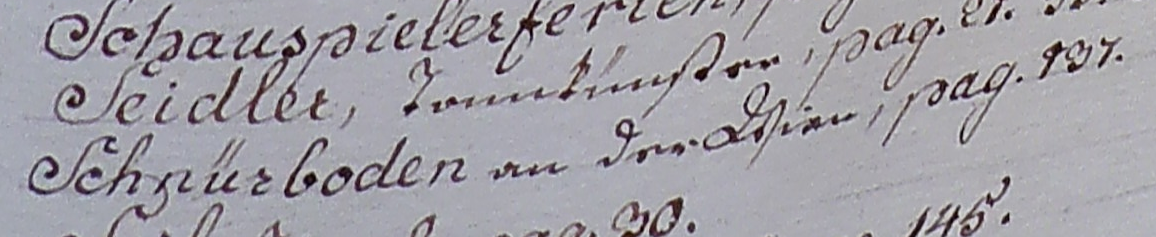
Schnürboden an der Wien, pag. 137,
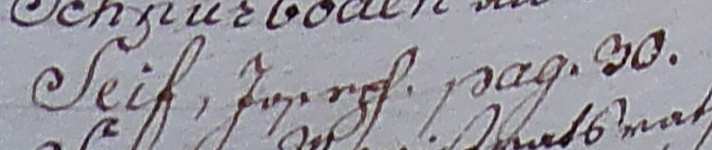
Seif, Joseph, pag. 30.
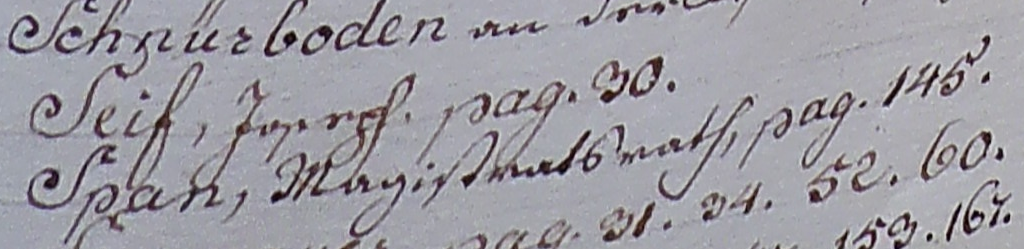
Span, Magistratsrath, pag. 145.
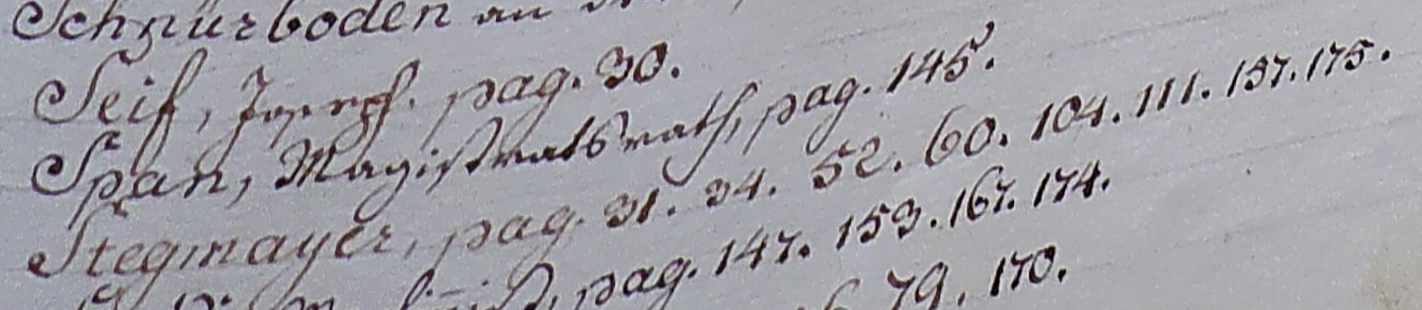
Stegmayer, pag. 31. 34. 52. 60. 104. 111. 157. 175.
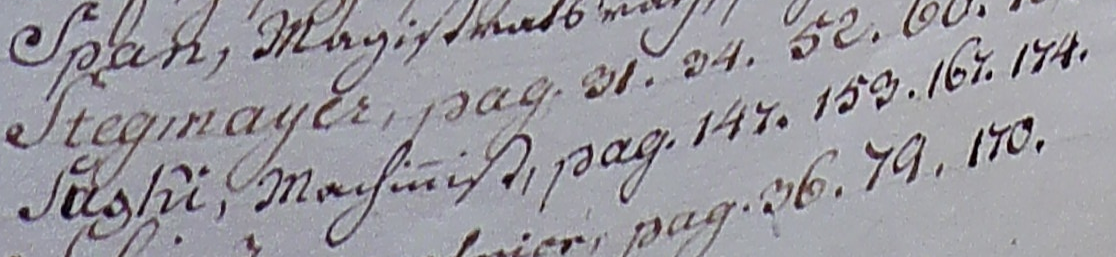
Suski, Maschinist, pag. 147. 153. 167. 174.
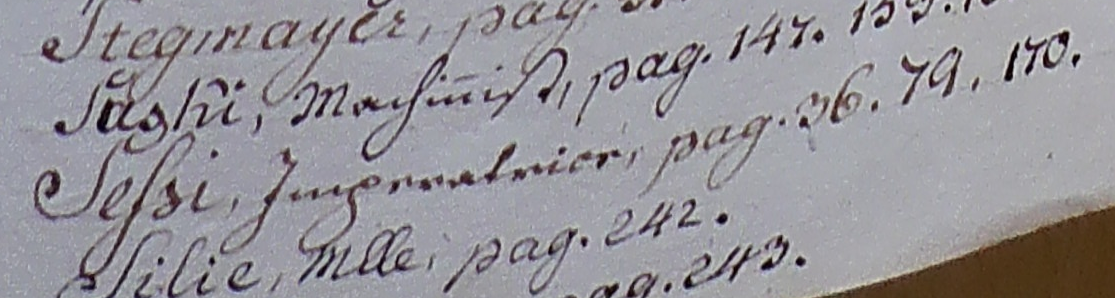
Sessi, Imperatrice, pag. 36. 79. 170.
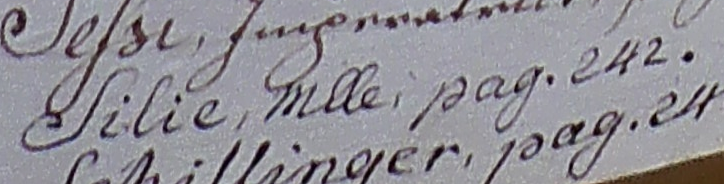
Silie, Mlle, pag. 242.
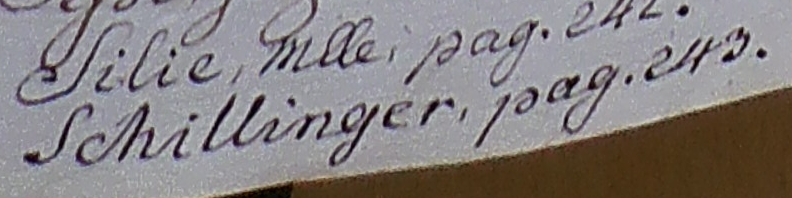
Schillinger, pag. 243.
